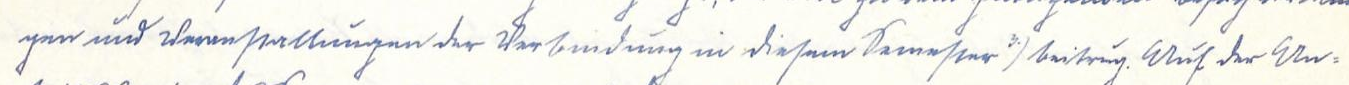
pen und Veranstaltungen der Verbindung in diesem Semester 2) beitrug. Auf der An-
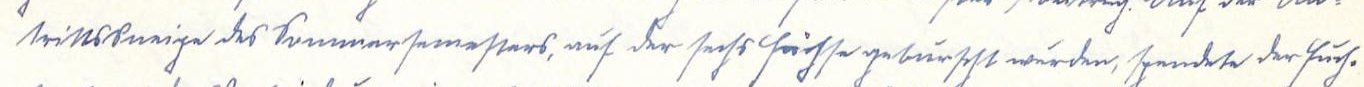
trittskneipe des Sommersemesters, auf der sechs Füchse geburscht wurden, spendete der Fuch-senstall
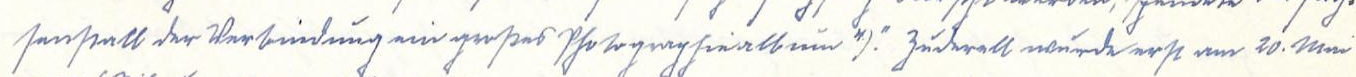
der Verbindung ein großes Photographiealbum 4) Zuderell wurde erst am 20. Mai
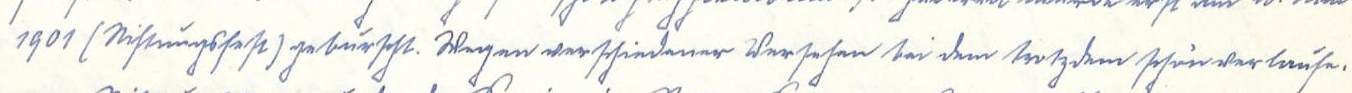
1901 (Stiftungsfest) geburscht. Wegen verschiedener Versehen bei dem trotzdem schön verlaufe-
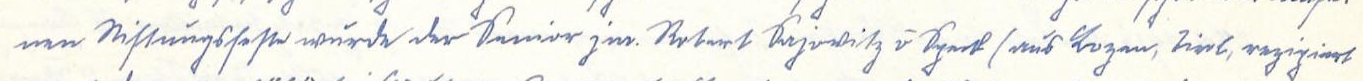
nen Stiftungsfeste wurde der Senior Robert Sajovitz v/o Sprick (x) (aus Bozen, rezipiert
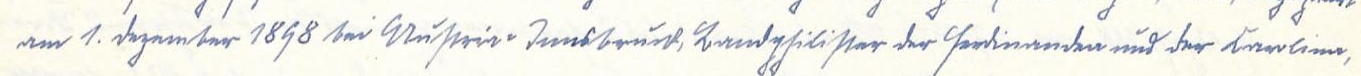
am 1. Dezember 1898 bei Austria Innsbruck, Bandphilister der Ferdinandea und der Carolina,
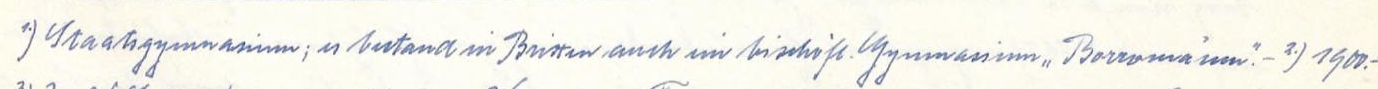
1) Staatsgymnasium; es bestand in Brixen auch ein bischöfliches Gymnasium „Borromianum“.- 2) 1900.
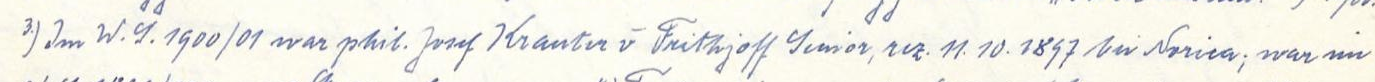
Im WS 1900/01 war phil. Josef Krauter v/o Fritzjoff, Senior, rez. 11.10.1897 bei Norica, war im
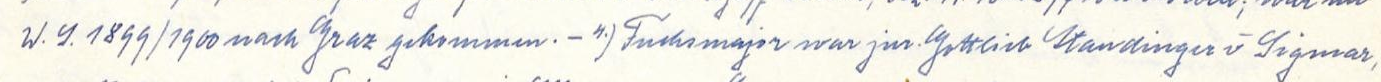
WS 1899/1900 nach Graz gekommen.- 4) Fuchsmajor nar. iur. Gottlieb Staudinger v/o Sigmar,
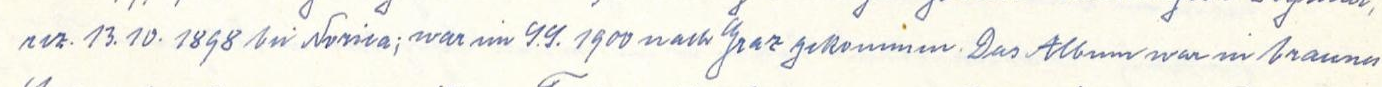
rez. 13.10.1898 bei Norica; war im SS 1900 nach Graz gekommen. Das Album war in braunes
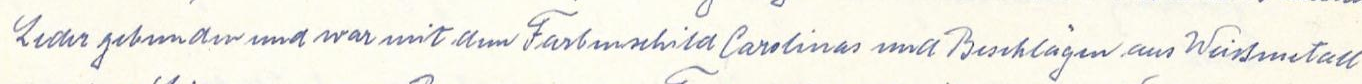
Leder gebunden und war mit dem Farbenschild Carolinas und Beschlägen aus Weißmetall
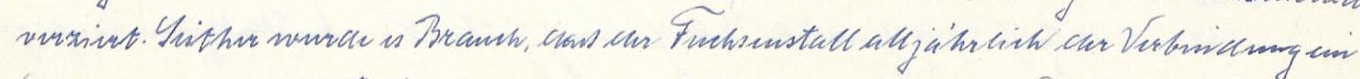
verziert. Seither wurde es Brauch, dass der Fuchsenstall alljährlich der Verbindung ein
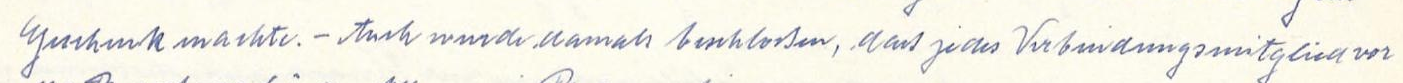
Geschenk macht.-Auch wurde damals beschlossen, dass jedes Verbindungsmitglied vor
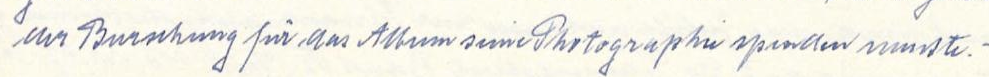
der Burschung für das Album seine Photographie spenden mußte.-
